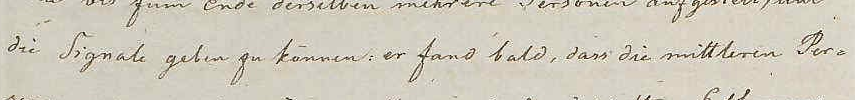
die Signale geben zu können: er fand bald, dass die mittleren Per-
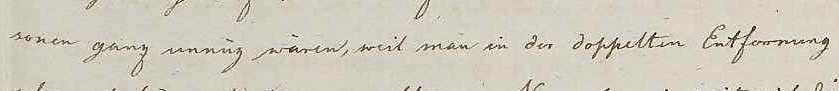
sonen ganz unnüz wären, weil man in der doppelten Entfernung
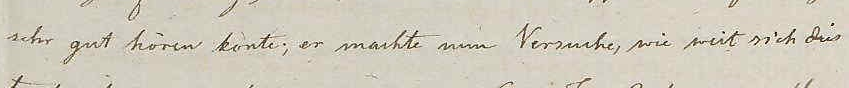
sehr gut hören konte; er machte nun Versuche, wie weit sich dies
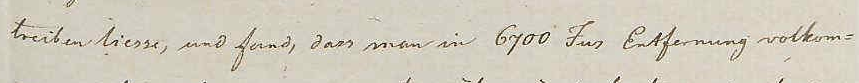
treiben liesse, und fand, dass man in 6700 Fus Entfernung volkom-
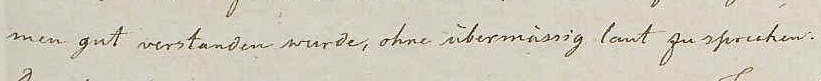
men gut verstanden wurde, ohne übermässig laut zu sprechen.
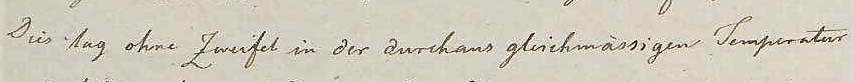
Dies lag ohne Zweifel in der durchaus gleichmässigen Temperatur
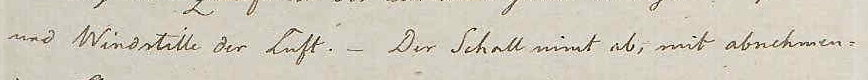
und Windstille der Luft. – Der Schall nimt ab, mit abnehmen-
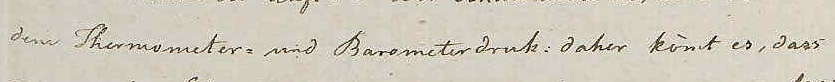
dem Thermometer- und Barometerdruk: daher kömt es, dass
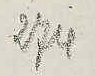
Weiten
